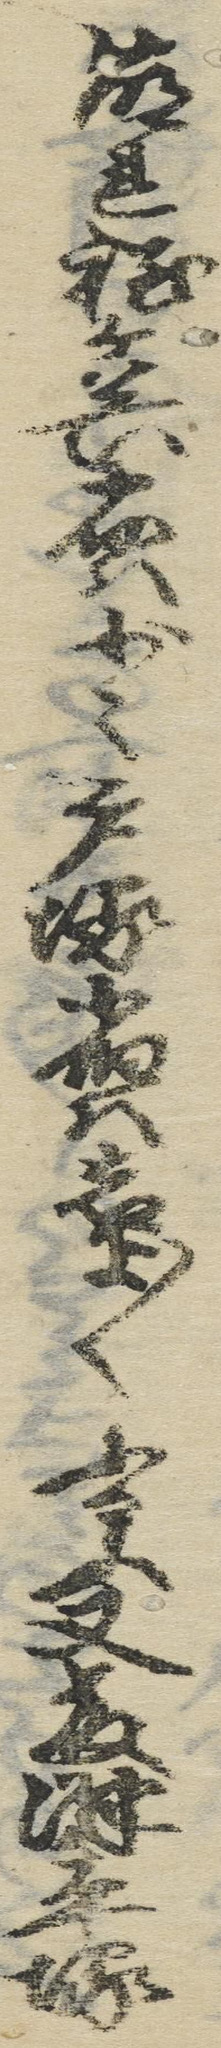崩れ程ヶ谷宿ハ少々戸塚宿ハしよ〳〵ふるふ又藤沢平塚
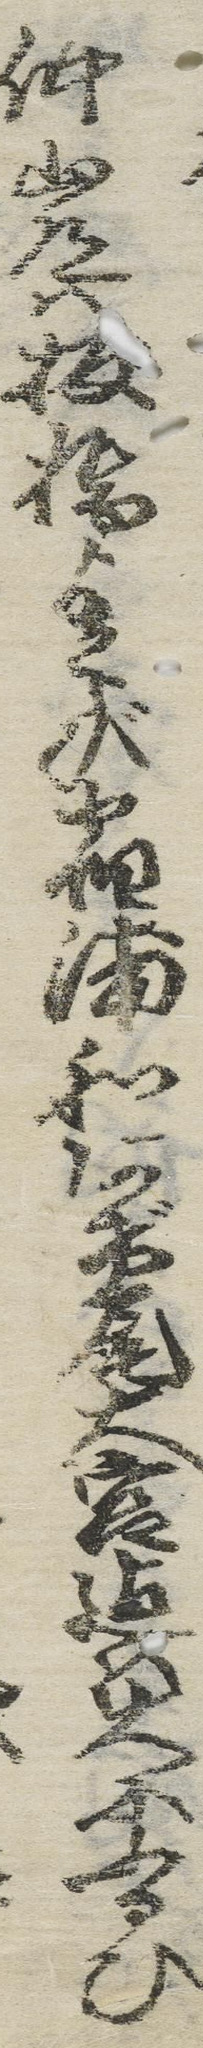仲山道ハ板橋ゟわらび宿浦和あげ尾大宮迄ハ大にふるひ
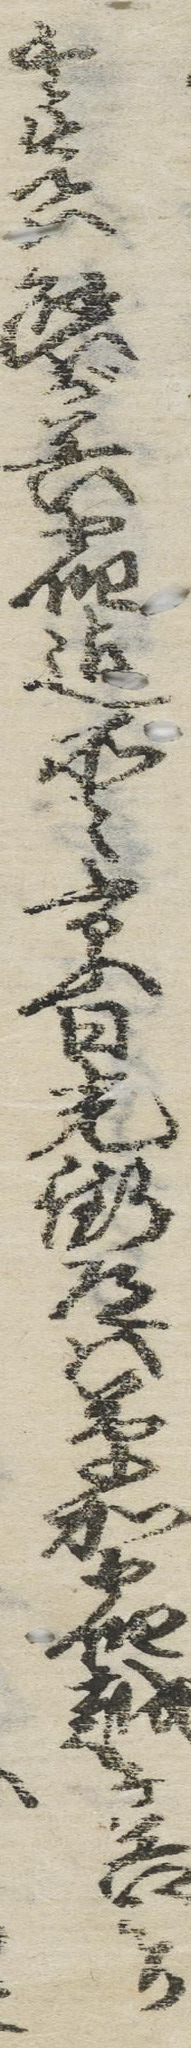其先ハ熊が谷宿迄所々ふるふ日光街道ハ草加宿越ヶ谷より
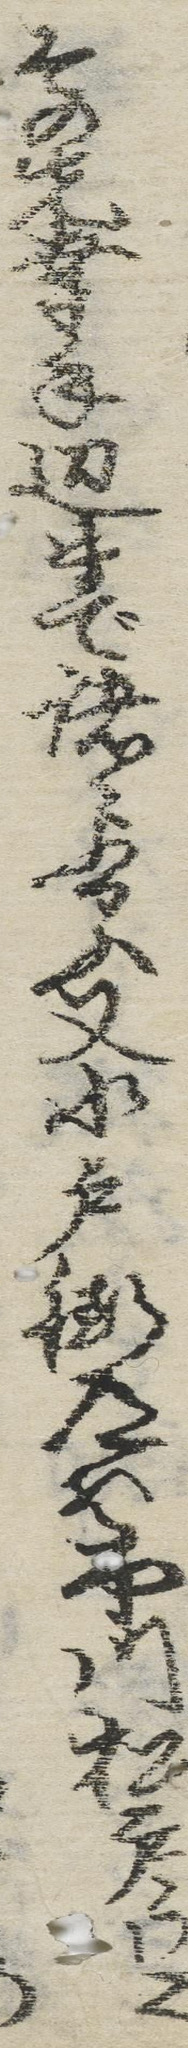その先幸手辺まで諸々ふるふ又水戸街道ハ市川松戸うしく
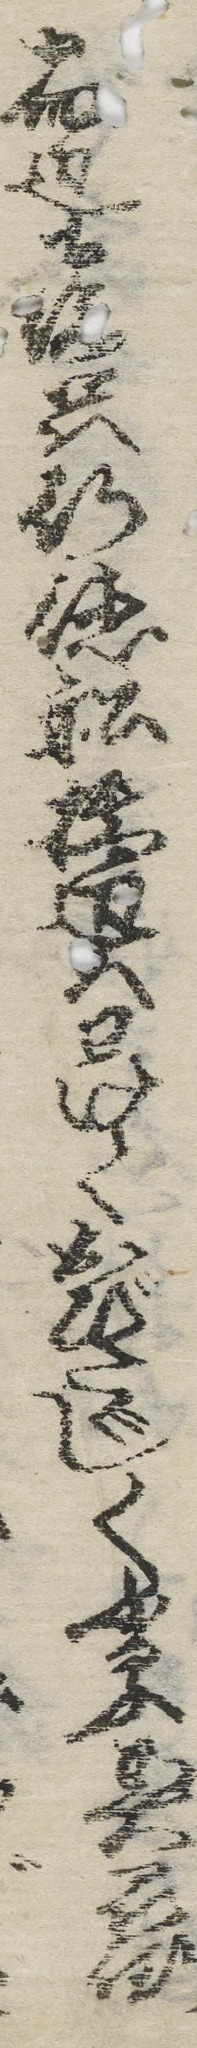宿辺下総州行徳船橋辺ハわひておびたゞしくふるふ奥州街
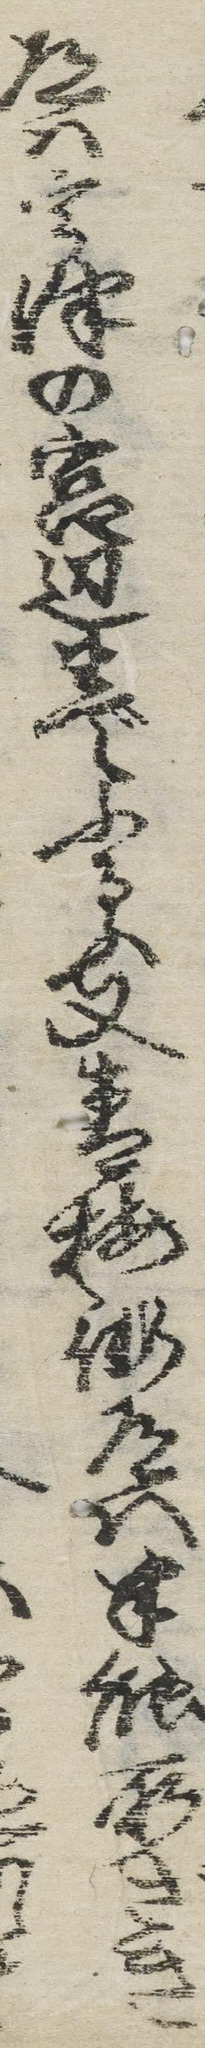道ハ宇津の宮辺までふるふ又青梅街道ハ半能所ざき
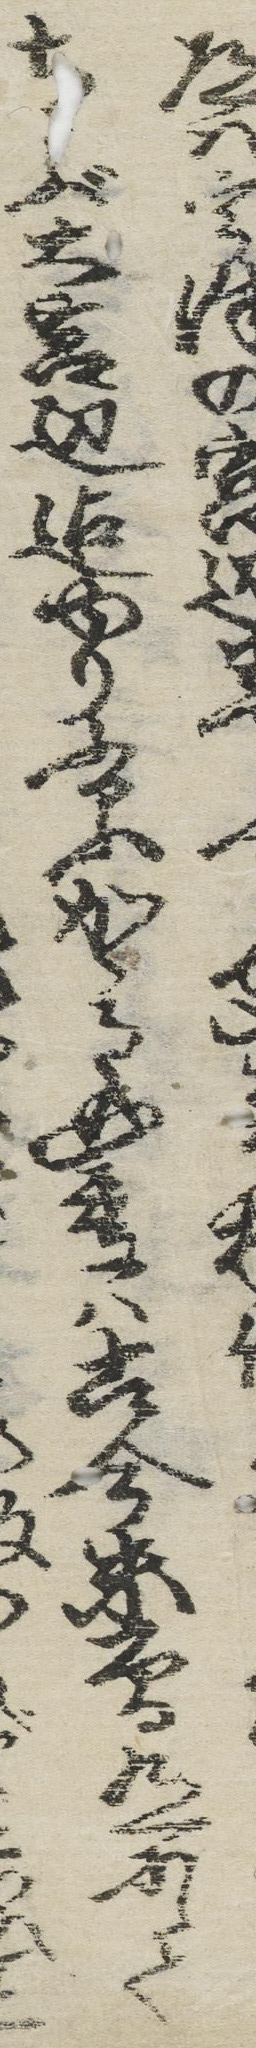ちゝぶ大宮辺迄ゆりふるふかゝる凶変ハ古今未曾有にて
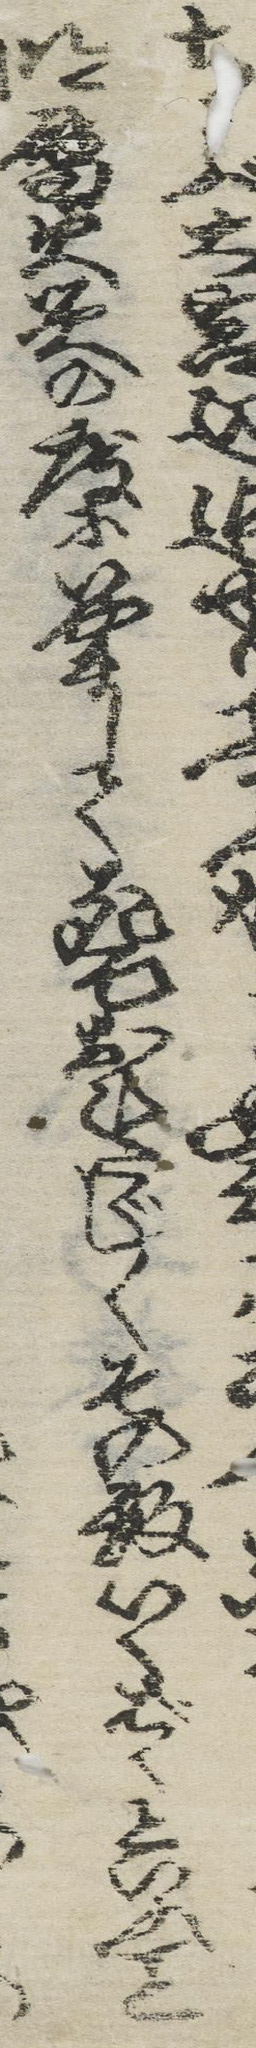明暦火災の度にいやまして死亡おびたゞしくその数いくばくといふを
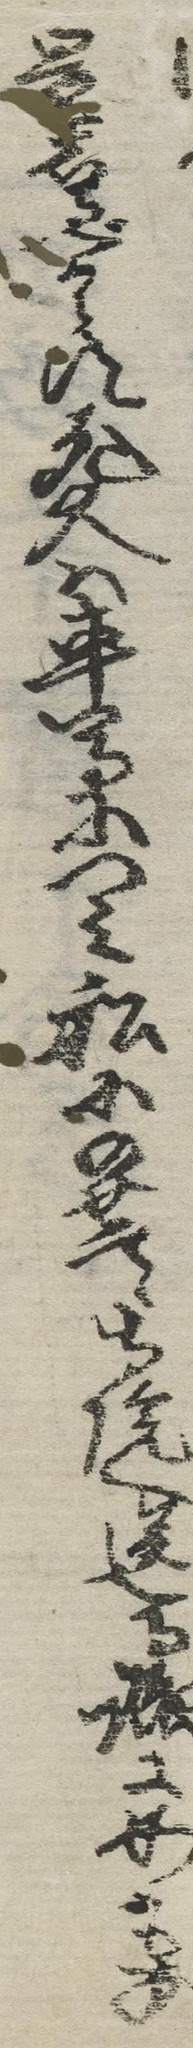量しるべからす死人ハ車等につミ船にのせて寺院へ送る誠にめもあ
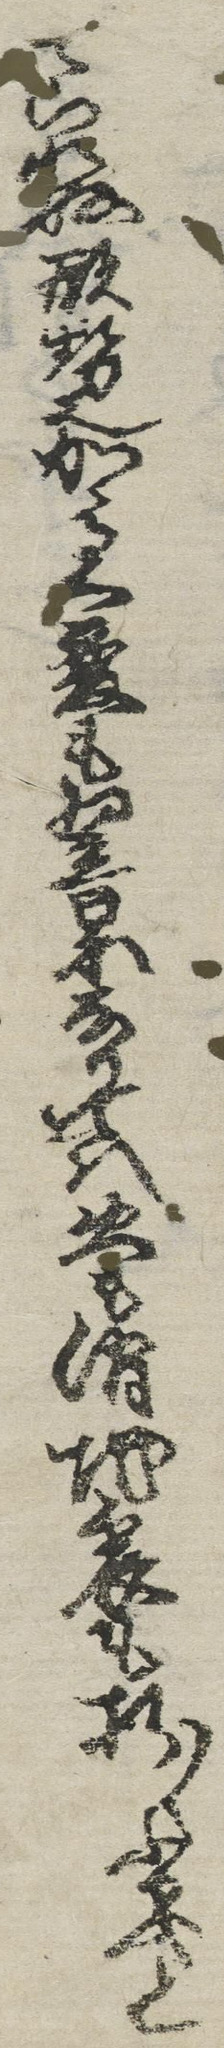てられぬ形勢也かゝる大変も翌日になりてハ火も消地震も折〳〵ふるふと

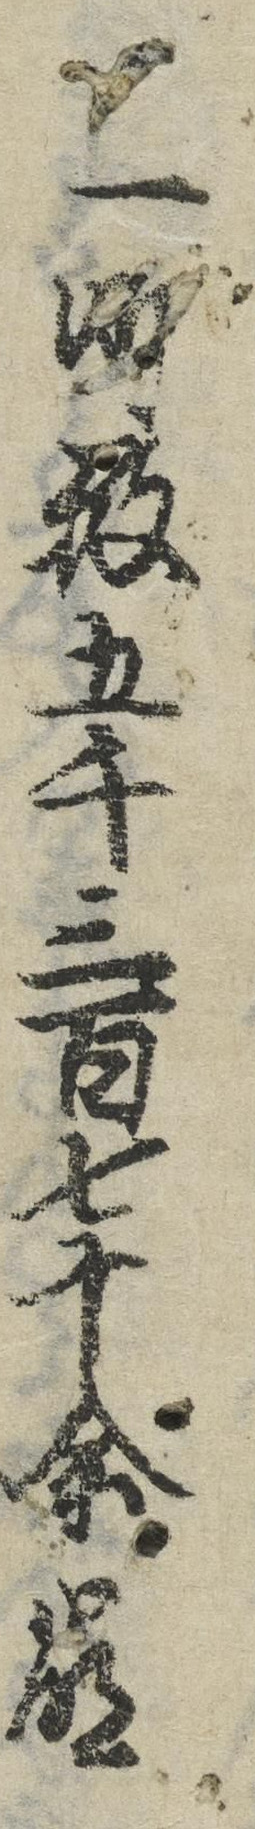一町数五千三百七十余崩
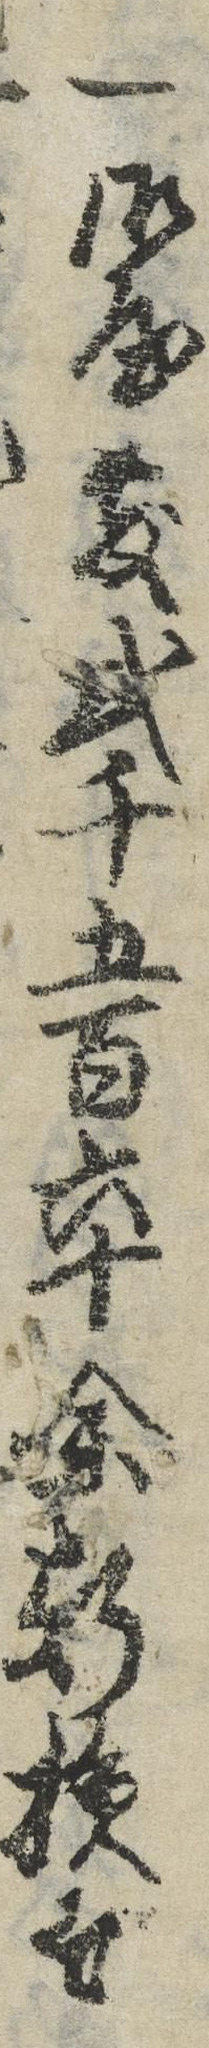一御屋敷弐千五百六十余軒損す
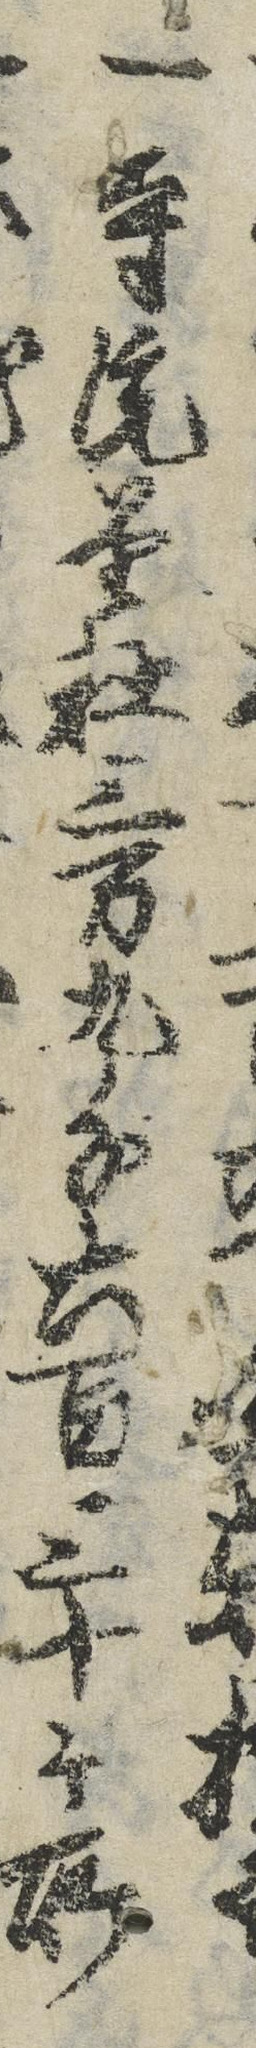一寺院堂社三万九千六百三十ヶ所
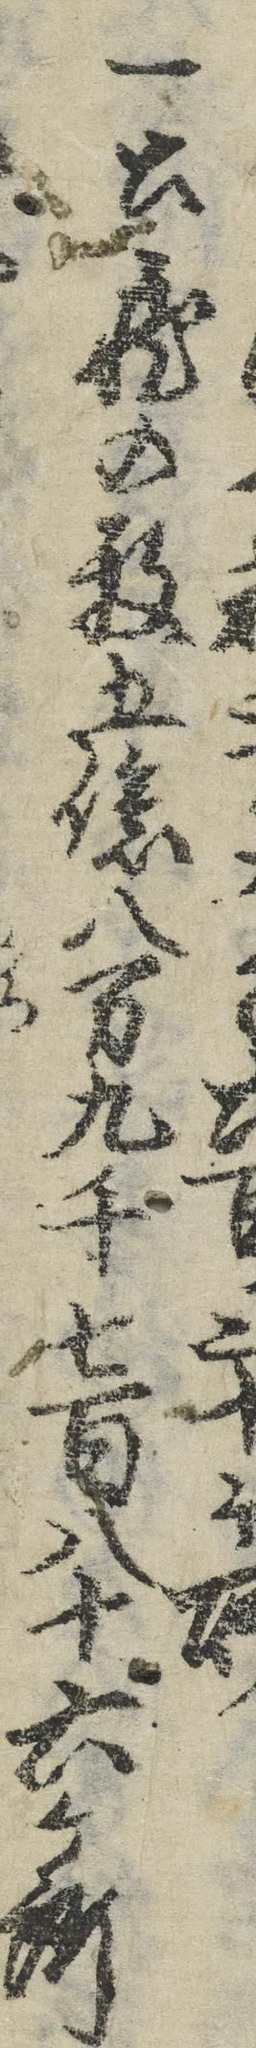一土蔵の数五億八万九千七百八十六ヶ所
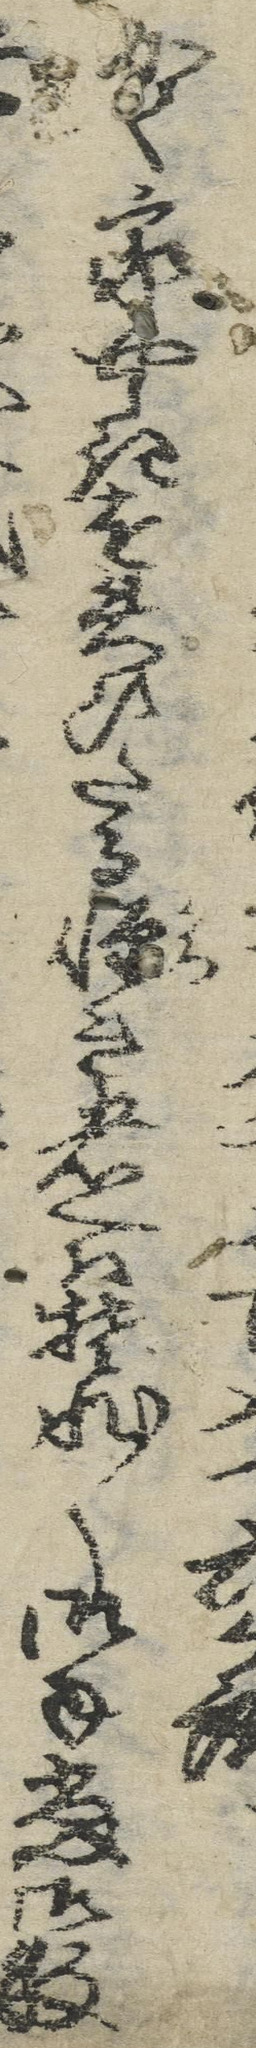かく家中きを失ひたる軽き者へハそれ〳〵御手当御救
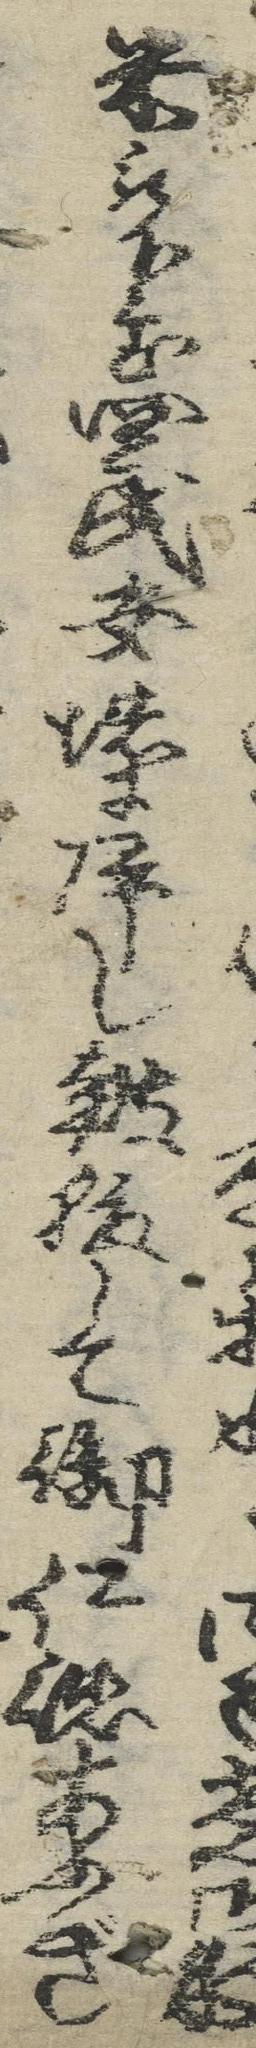米被下置四民安堵に帰し報服して御仁徳あふぎ
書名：御府内五街道　大地しん
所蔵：東京大学地震研究所図書室 Earthquake Research Institute Library, The University of Tokyo, JAPAN
